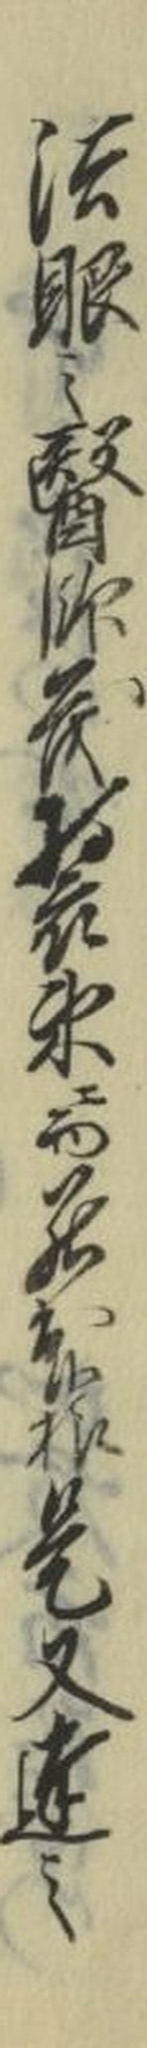法眼之医師も装束に而罷出候様是又達之
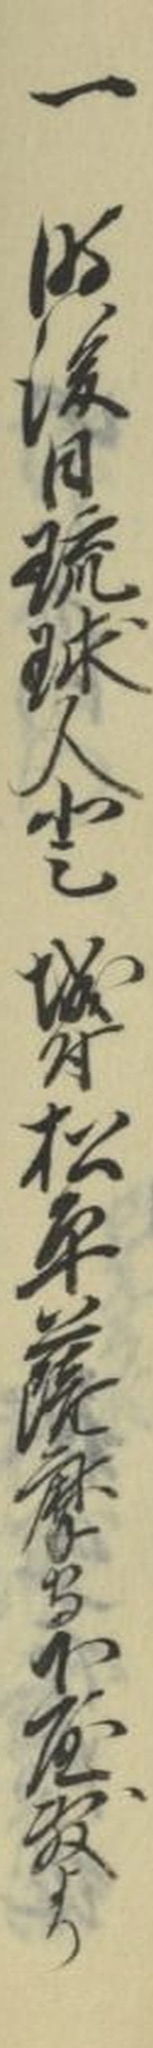一明後日琉球人登城付松平薩摩守下屋敷より
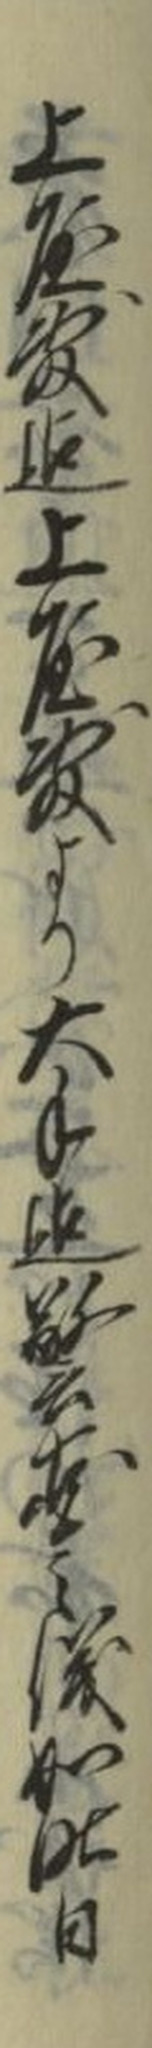上屋敷迄上屋敷より大手迄警固之儀如昨日
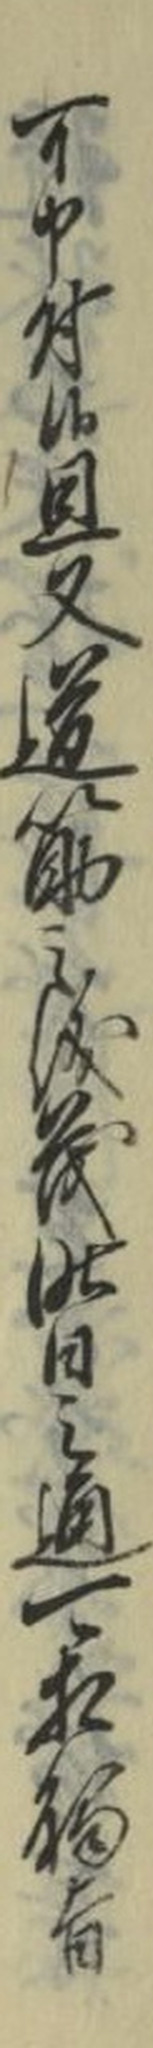可申付候且又道筋之儀も昨日之通可相触旨
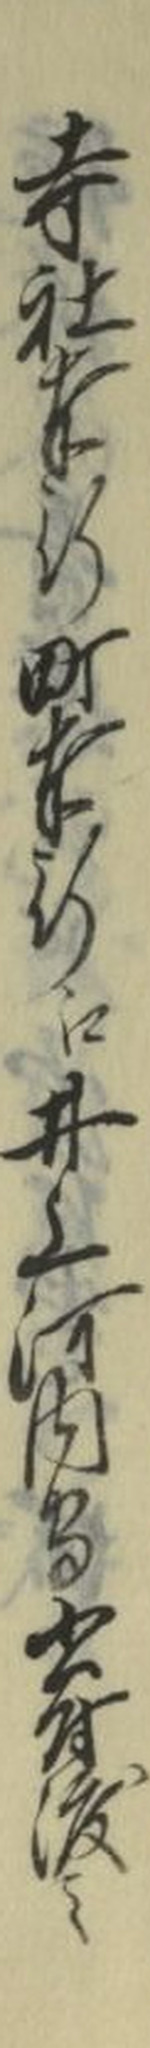寺社奉行町奉行え井上河内守書付渡之
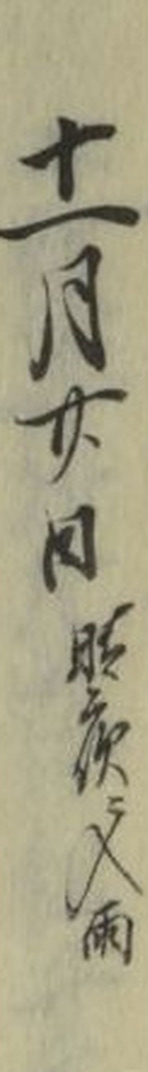十一月廿日晴夜に入雨
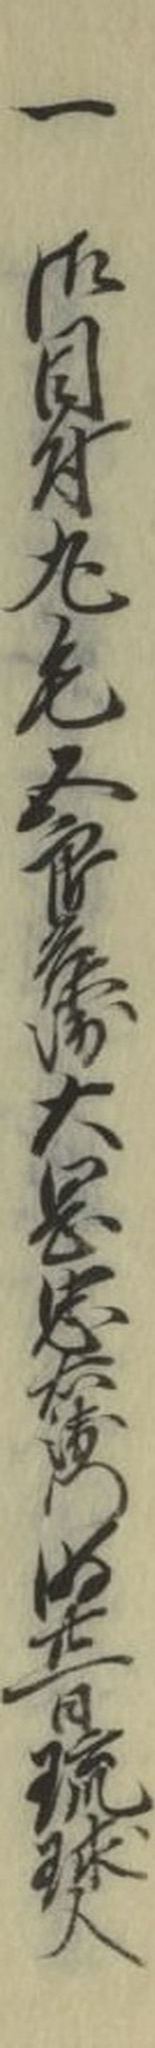一御目付丸毛五郎兵衛大岡忠右衛門明廿一日琉球人
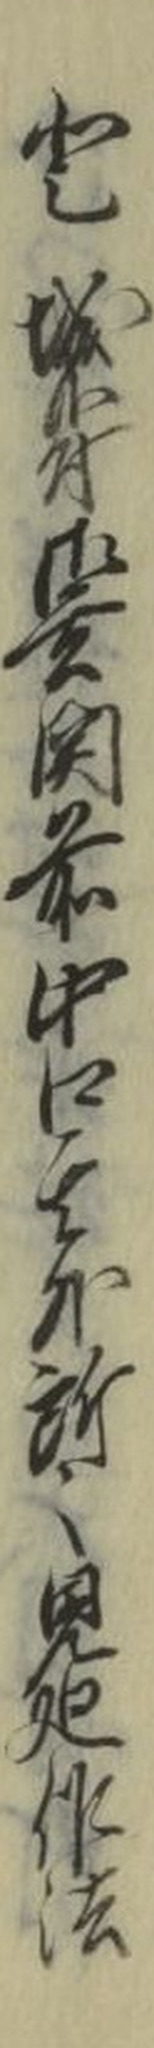登城候付御玄関前中口其外所々へ見廻作法
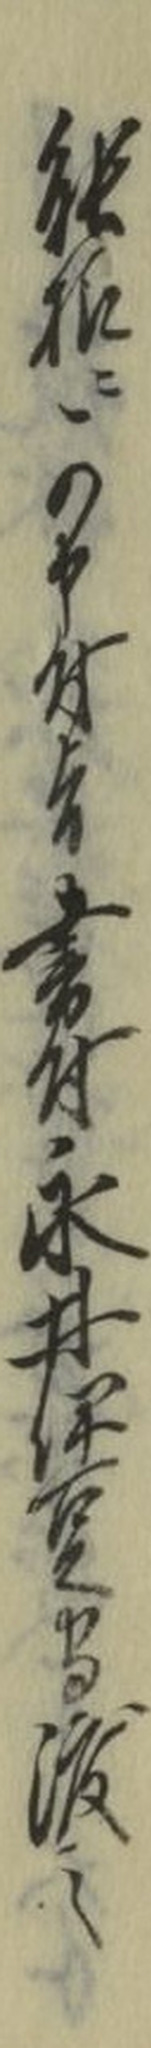能様に可申付旨書付永井伊豆守渡之

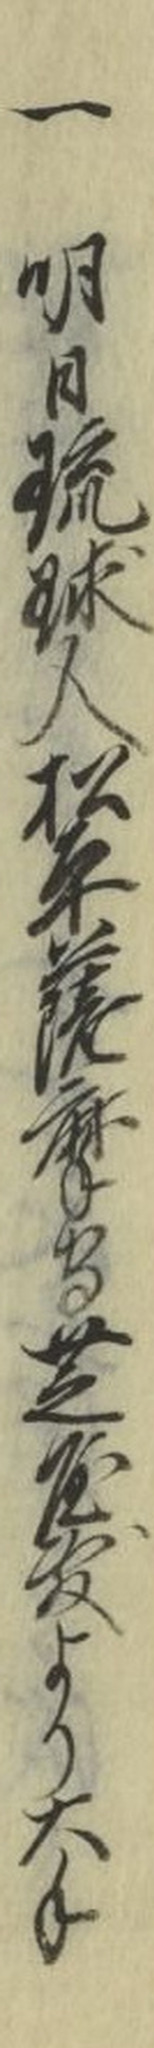一明日琉球人松平薩摩守芝屋敷より大手
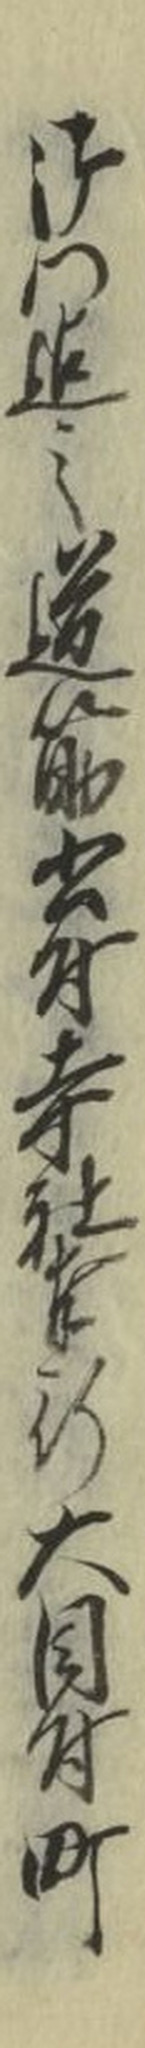御門迄之道筋書付寺社奉行大目付町
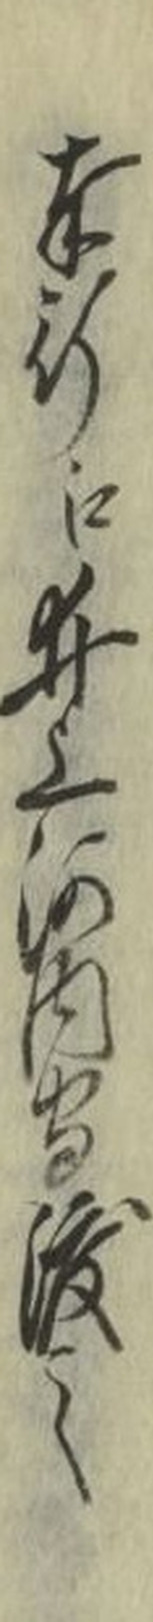奉行え井上河内守渡之
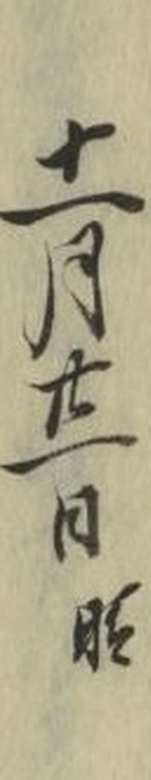十一月廿一日晴
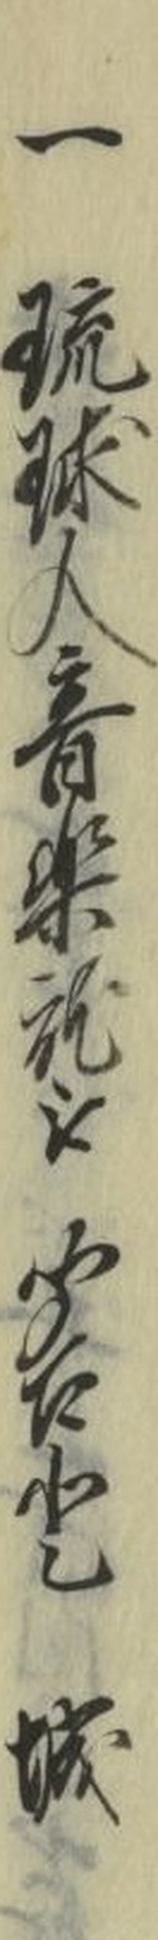一琉球人音楽就被聞召登城
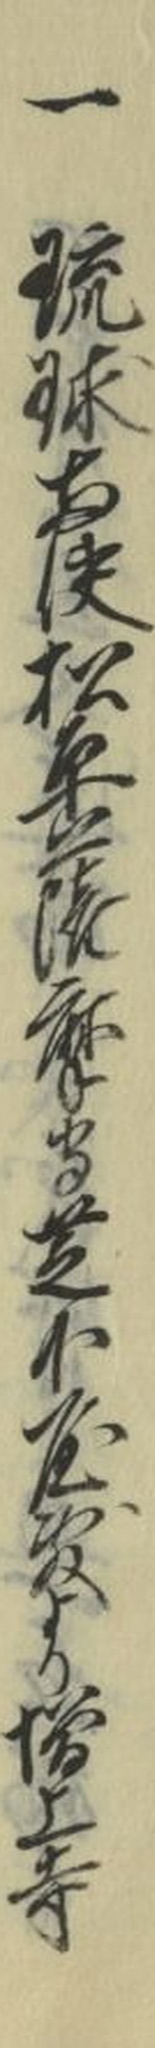一琉球両使松平薩摩守芝下屋敷より増上寺
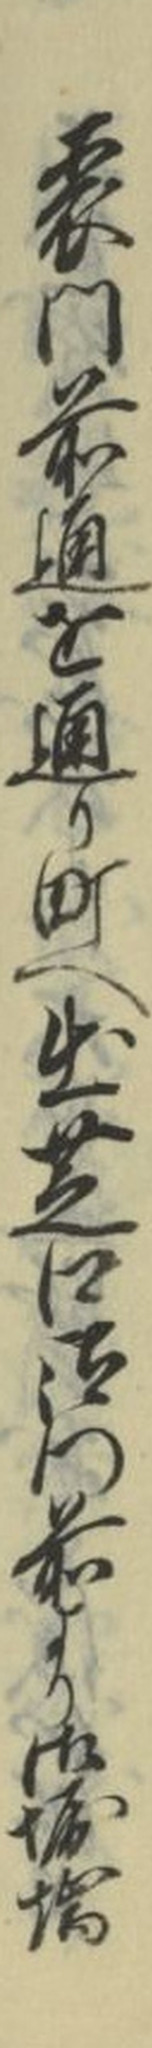裏門前通を通り町へ出芝口御門前より御堀端
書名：琉球人参府記
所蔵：University of the Ryukyus Library
